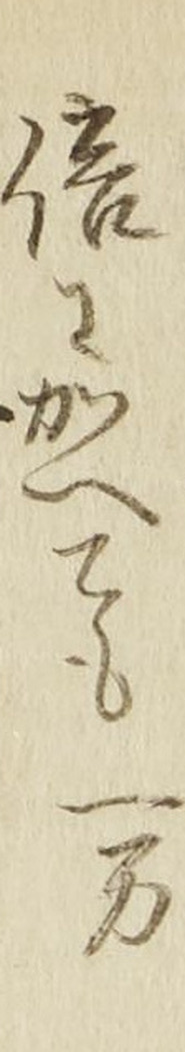倍に加へても一万
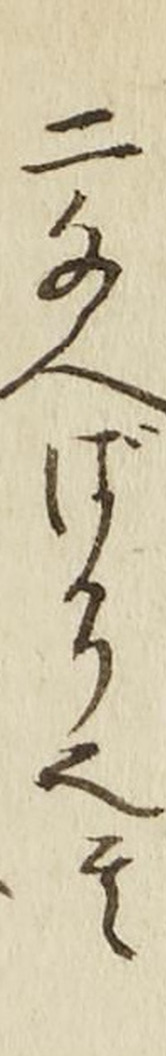二千人ばかり也其
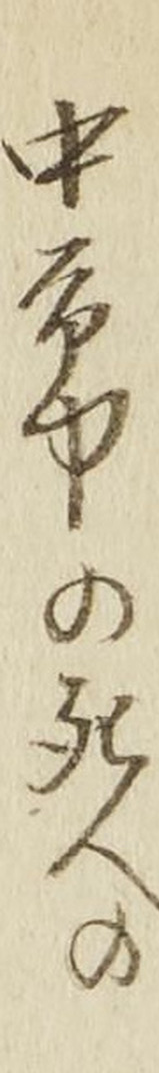中市中の死人の
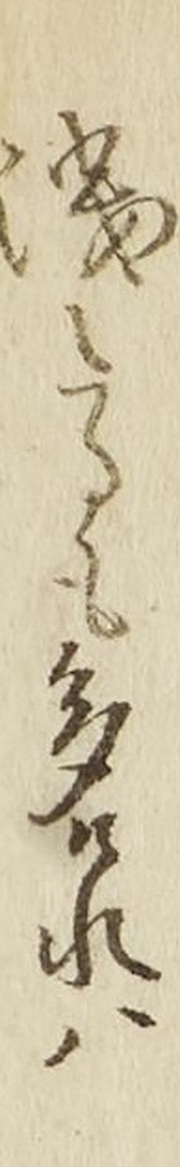洩たるも多けれは
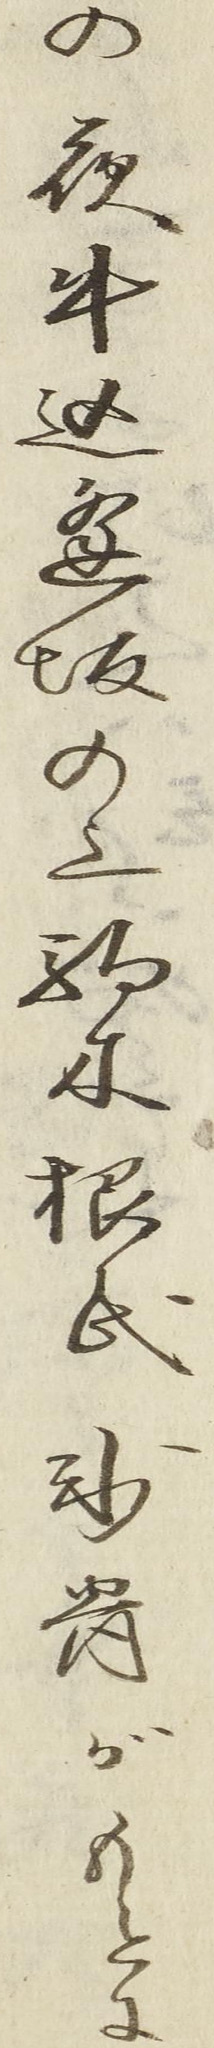の夜牛込逢坂の上駒木根氏氷骨がもとに
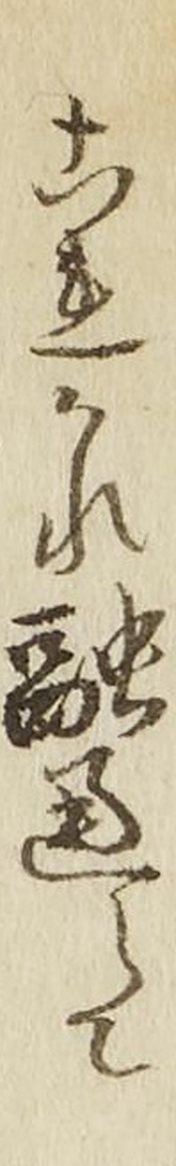これかれ融通して
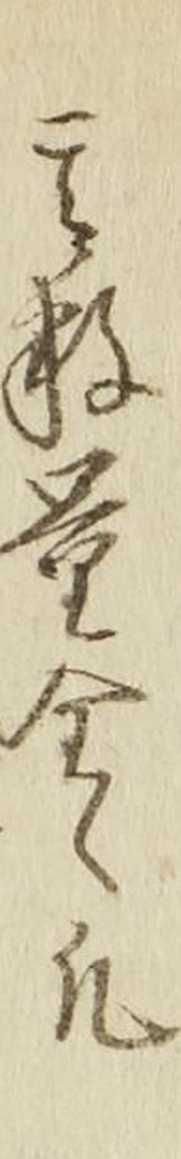其数量全く凡
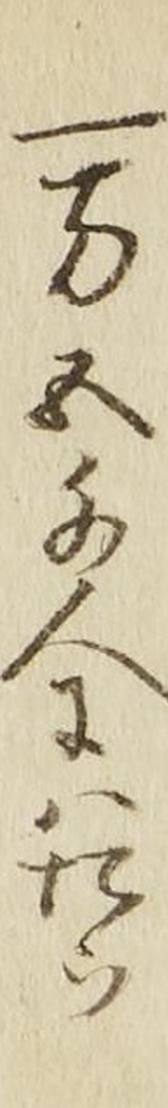一万五千人にはたら
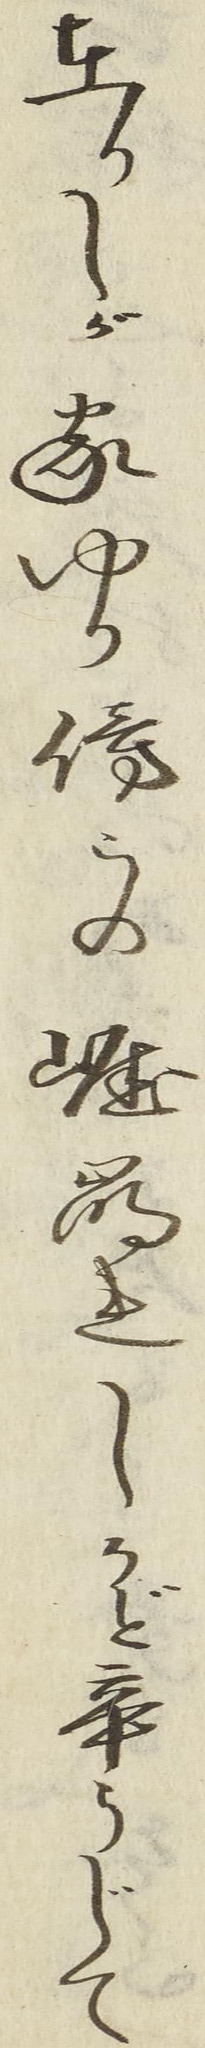在りしが家ゆり傍らの崖崩れしかど辛うじて
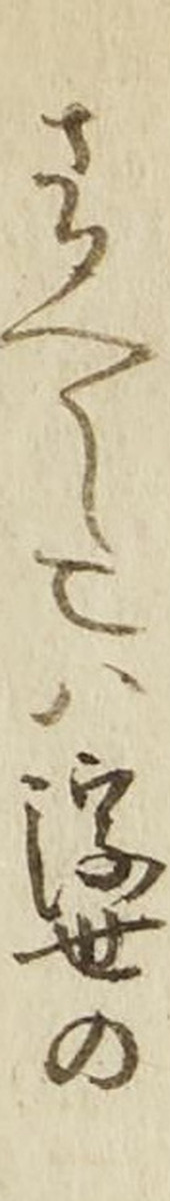さるへしこは浮世の
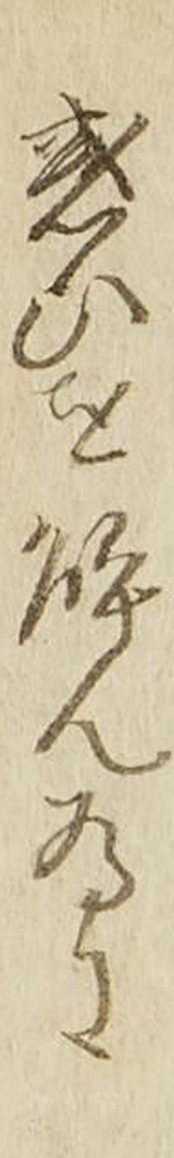惑ひを解ん為に
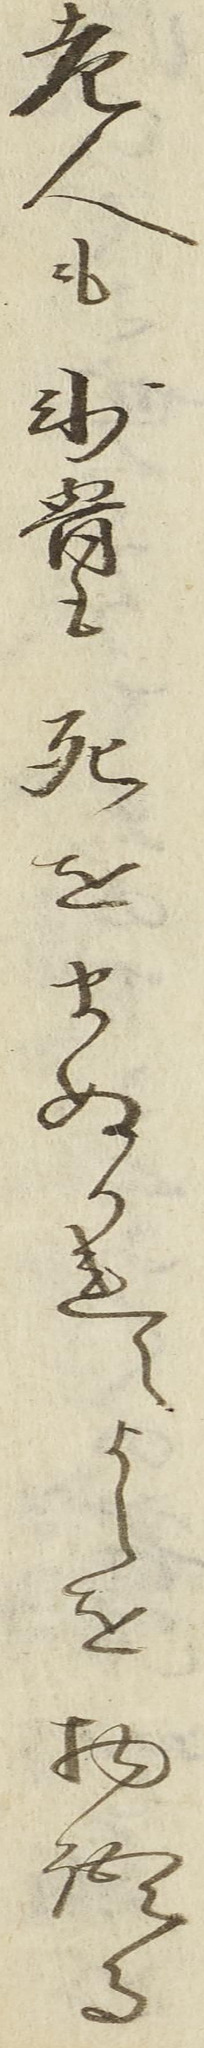老人も氷骨も死をまぬかれしよしを物語る
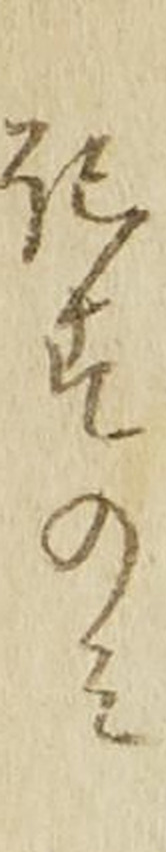記すのみ

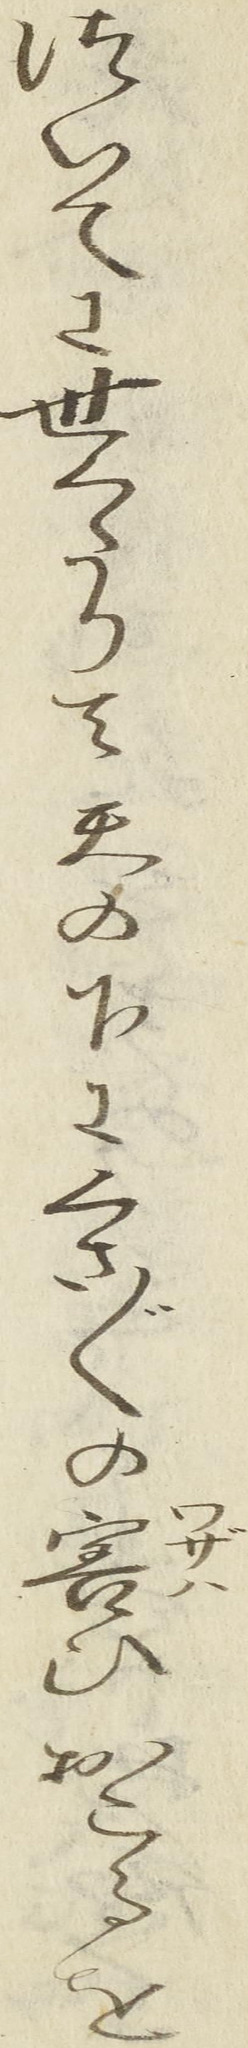ついてに世くたりて天の下にくさ〴〵の害ひおこるを
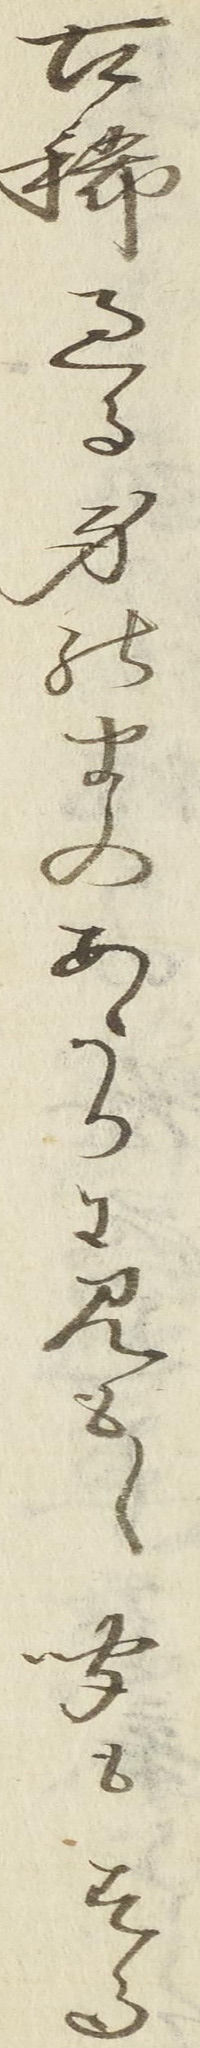古希過る身のまのあたりに見もし聞もする
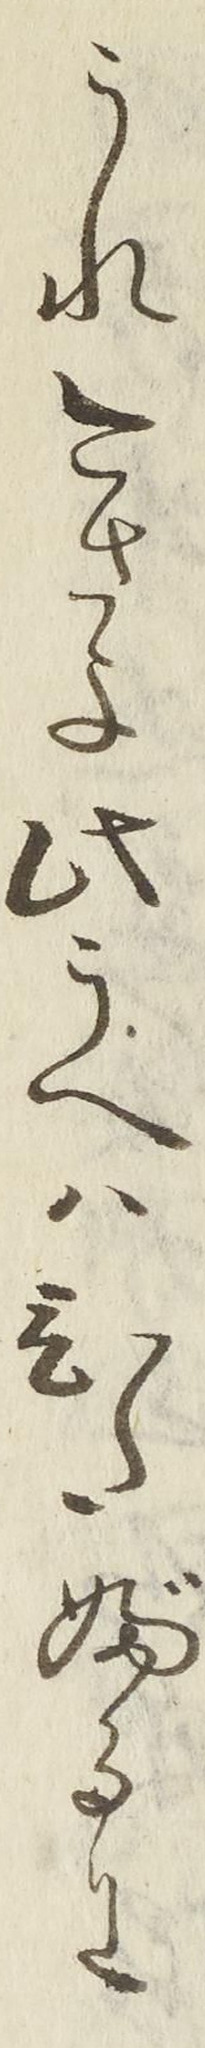うれたさに此うへはひたぶるに
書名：やぶれ窓の記　全
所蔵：東京大学地震研究所図書室 Earthquake Research Institute Library, The University of Tokyo, JAPAN
